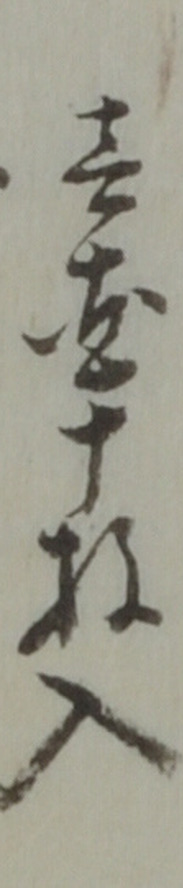壱固十枚入
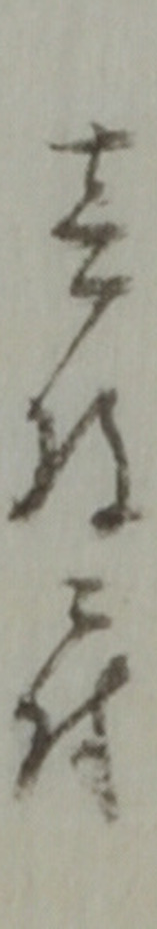壱枚ニ付
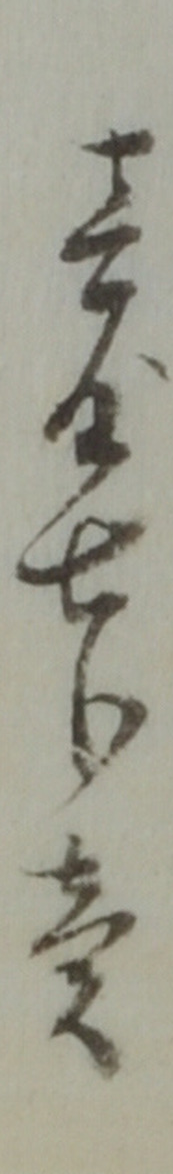壱匁七分売

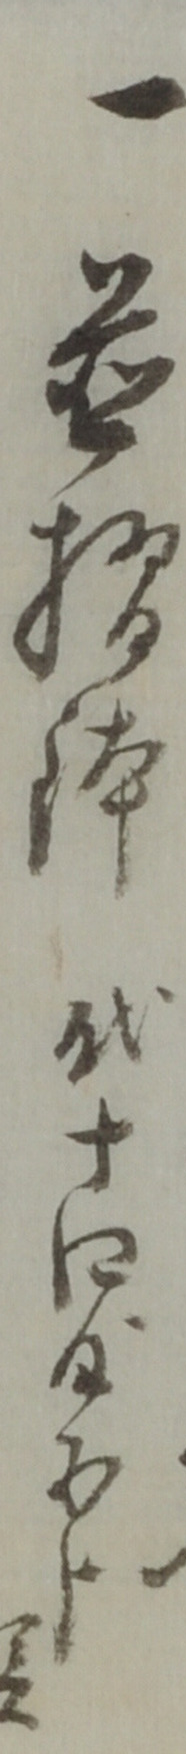一並摺鉢代十四匁五分買
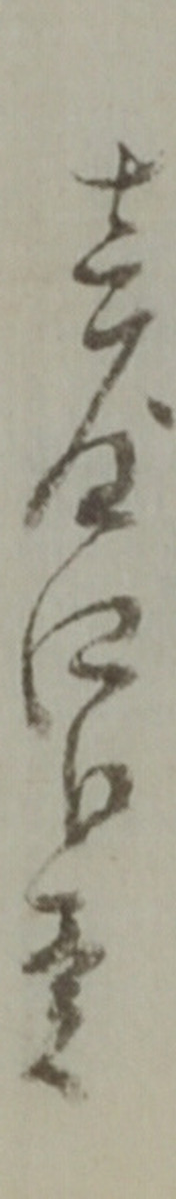壱匁四分売
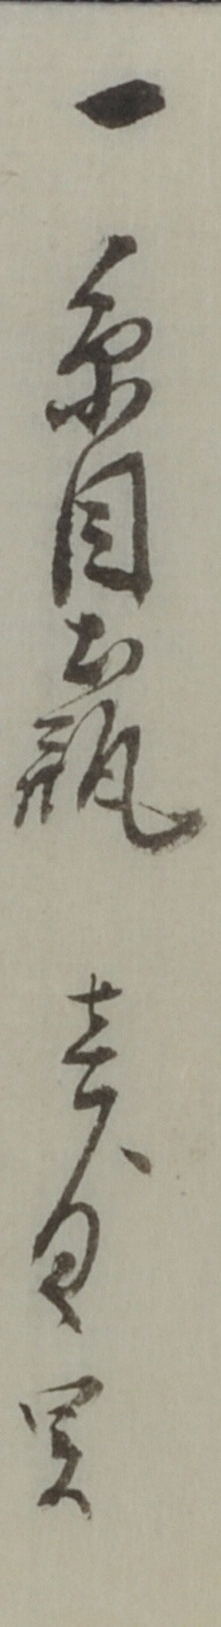一糸目土瓶壱匁買
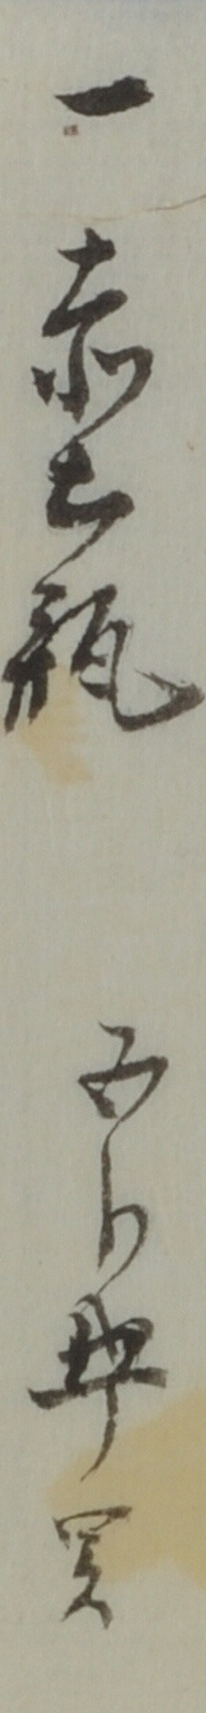一赤土瓶五分五厘買
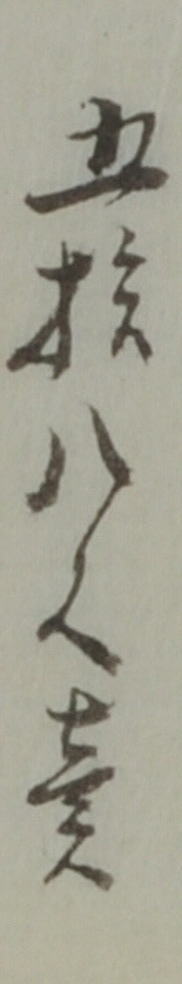五拾八文売

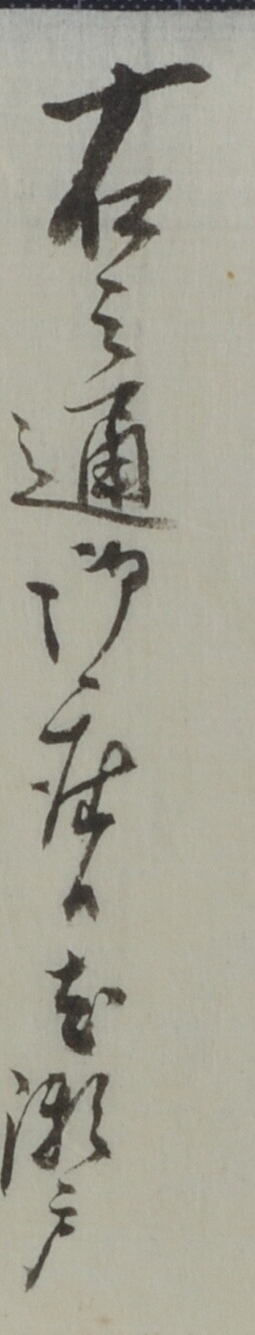右之通御座候尤瀬戸
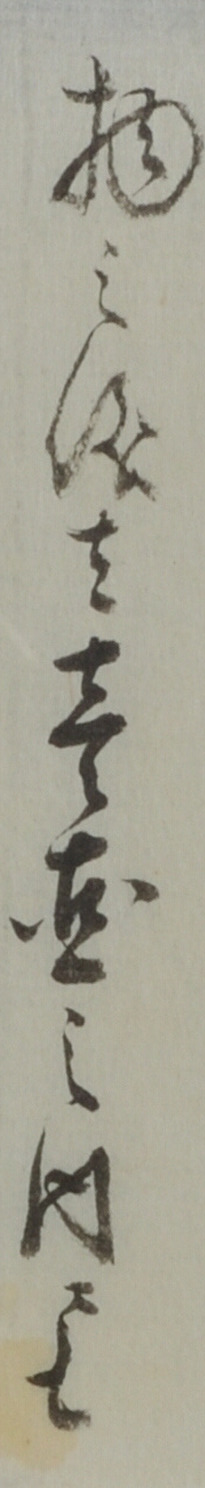物之儀者壱固之内ニも
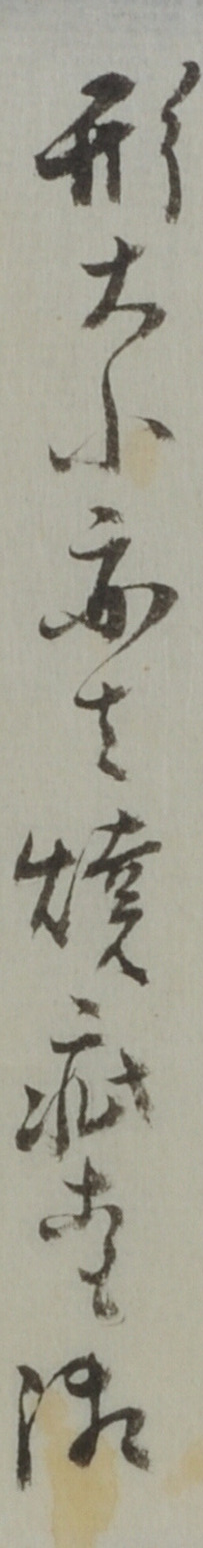形大小亦者焼疵等も御
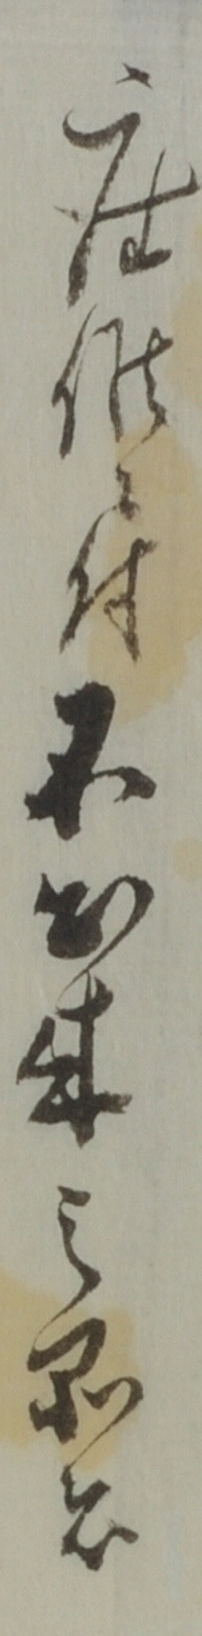座候ニ付不出来之品者
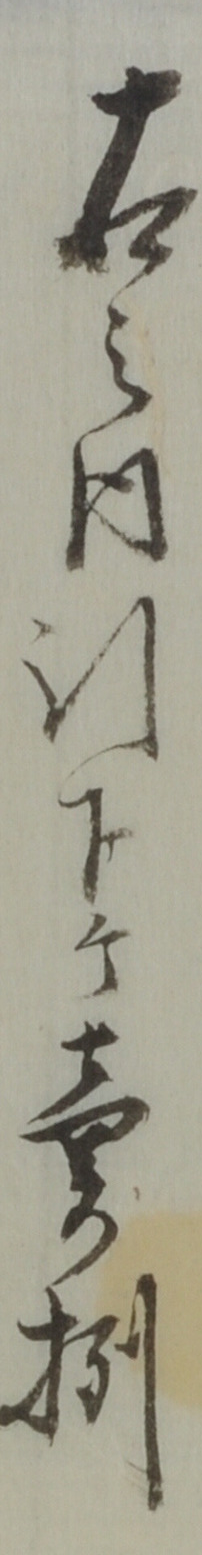右之内引下ヶ売捌
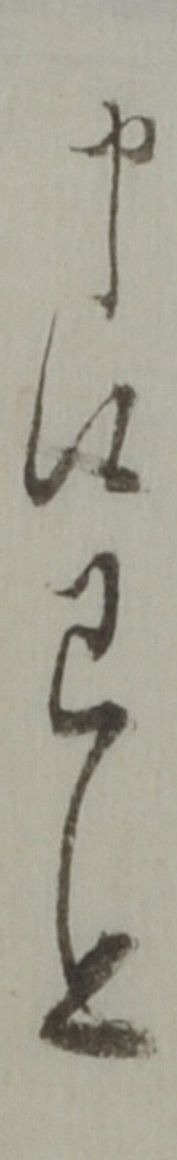申候已上
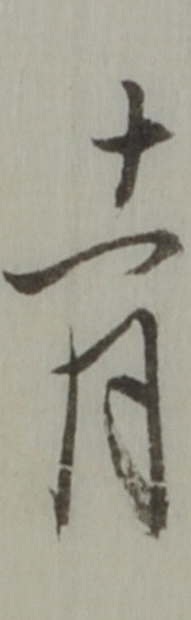十一月
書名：諸色當時直段書上帳扣
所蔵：伊那市立高遠町図書館・合同会社AMANE
